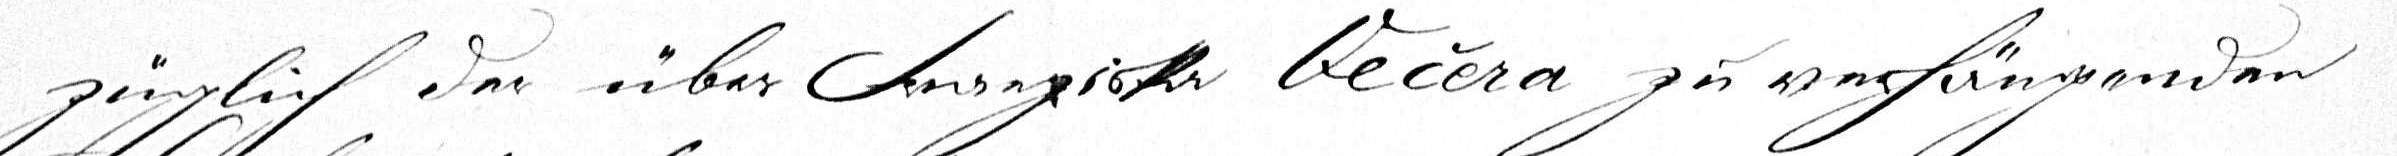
bezüglich der über Franziska Večera zu verhängenden
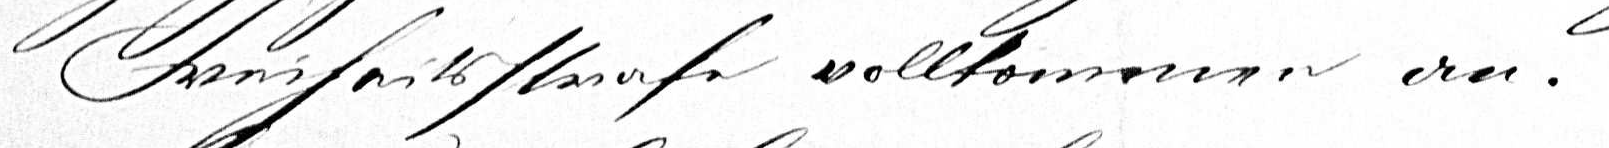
Freiheitsstrafe vollkommen an.
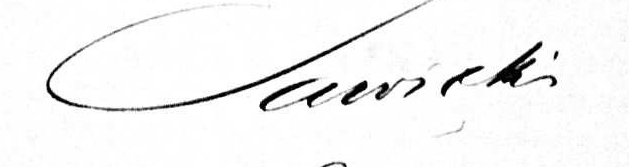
Sawicki
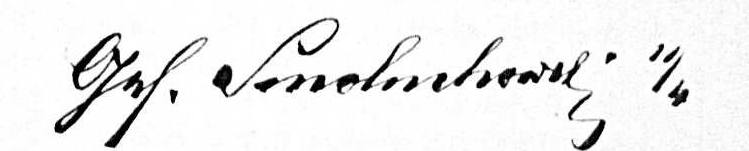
Ges. Smolenkowski 11/4
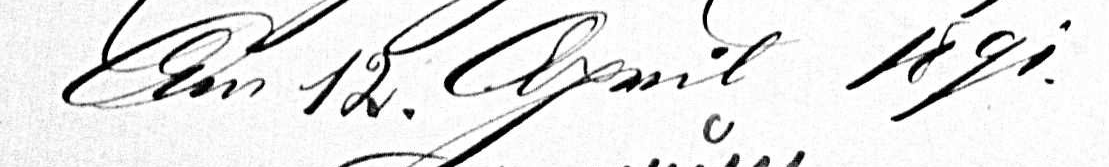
Am 12. April 1891
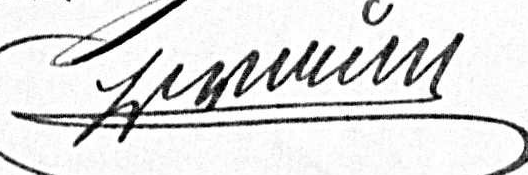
Wrauny
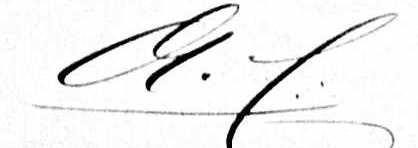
AE
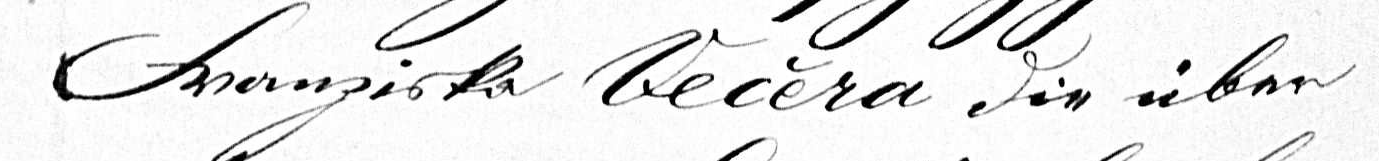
Franziska Večera die über
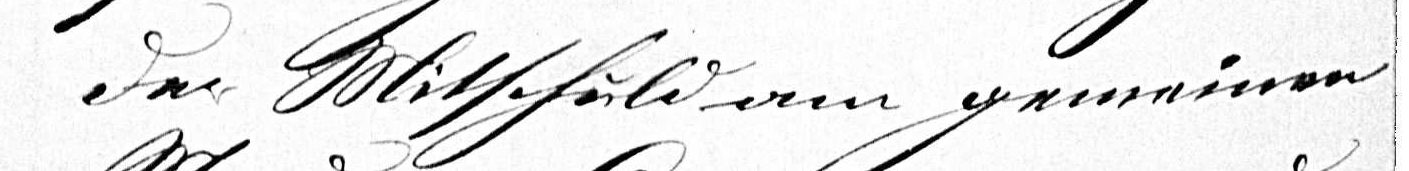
der Mitschuld am gemeinen
